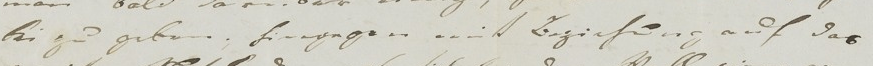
bei zu geben; hingegen mit Beziehung auf das
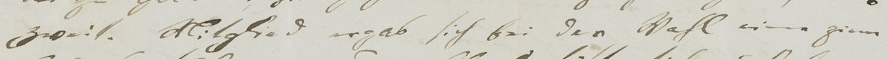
zweite Mitglied ergab sich bei der Wahl eine ziem-
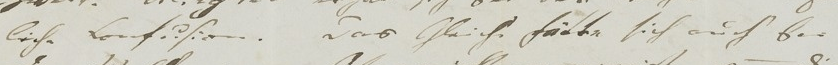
liche Confusion. Das Gleiche hätte sich auch bei
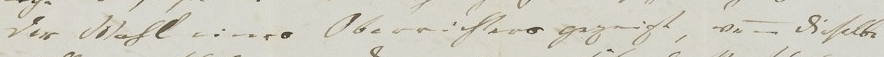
der Wahl eines Oberrichters gezeigt, wenn dieselbe
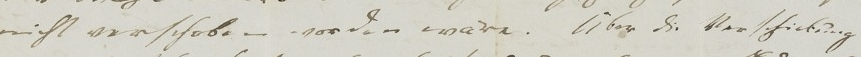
nicht verschoben worden wäre. Über die Verschiebung
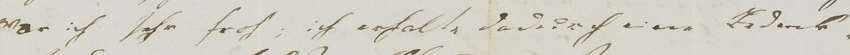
war ich sehr froh; ich erhalte dadurch eine Bedenk-
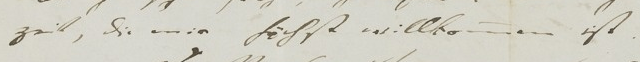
zeit, die mir höchst willkommen ist.
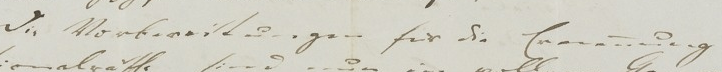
Die Vorbereitungen für die Ernennung
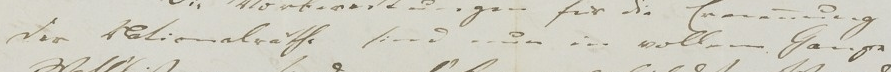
der Nationalräthe sind nun in vollem Gange.
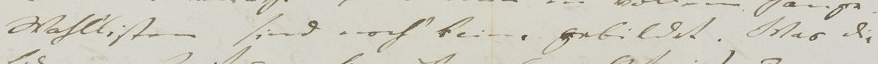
Wahllisten sind noch keine gebildet. Was die
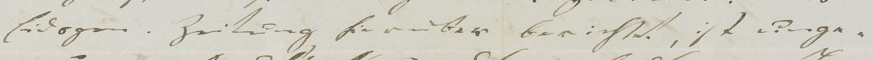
Eidsgen. Zeitung hierüber berichtet, ist unge-
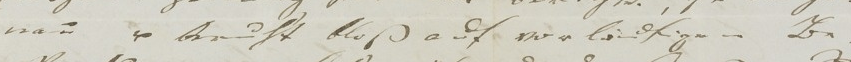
nau & beruht bloß auf vorläufigen Be-
